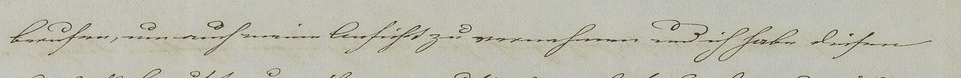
berufen, um auch meine Ansicht zu vernehmen und ich habe diesen
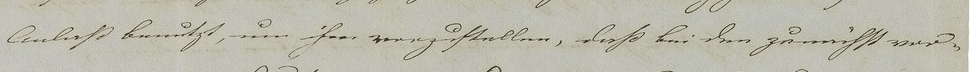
Anlaß benutzt, um ihm vorzustellen, daß bei den zunächst vor-
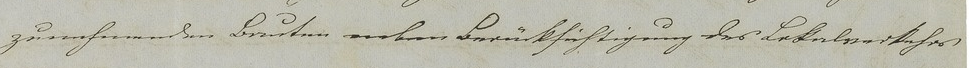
zunehmenden Bauten neben Berücksichtigung des Lokalverkehrs
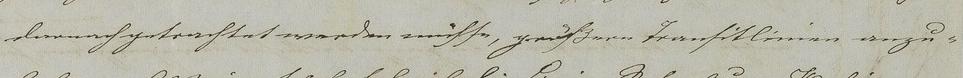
darnach getrachtet werden müsse, größere Transitlinien anzu-
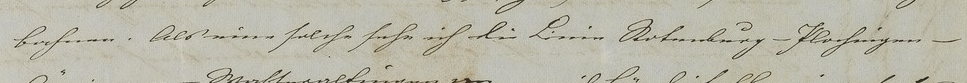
bahnen. Als eine solche sehe ich die Linie Rotenburg–Plochingen–
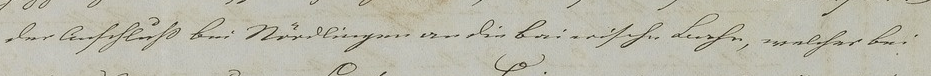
der Anschluß bei Nördlingen an die baierische Bahn, welcher bei
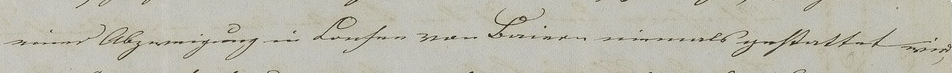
einer Abzweigung in Lonsee von Baiern niemals gestattet wird,
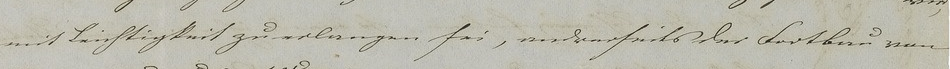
mit Leichtigkeit zu erlangen sei, andrerseits der Fortbau von
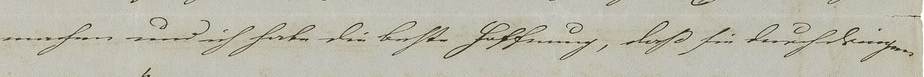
machen und ich habe die beste Hoffnung, daß sie durchdringen
